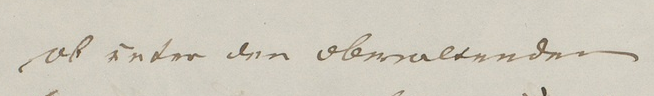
ob unter den obwaltenden
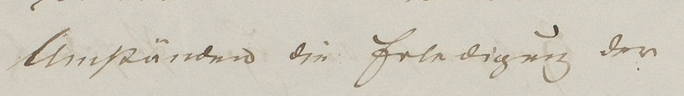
Umständen die Erledigung der
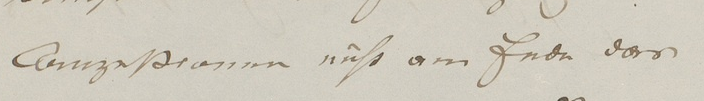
Conzessionen nicht am Ende das
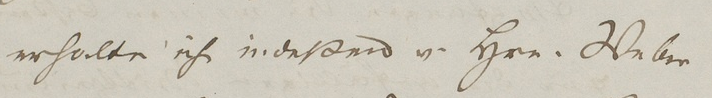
erhalte ich indeßenv. Hrn. Weber
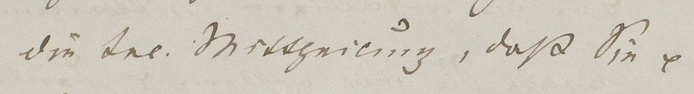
die tel. Mittheilung, daß Sie &
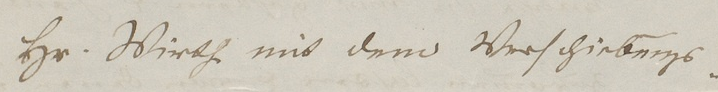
Hr. Wirth mit dem Verschiebungs-
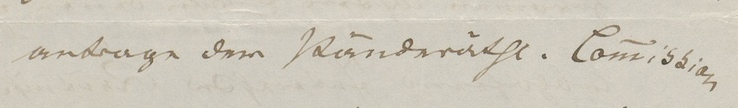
antrage der ständeräthl. Commission
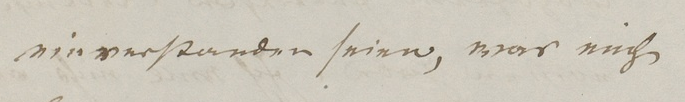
einverstanden seien, was mich
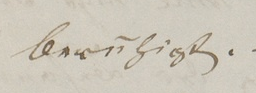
beruhigt. –
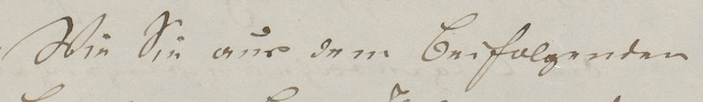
Wie Sie aus dem beifolgenden
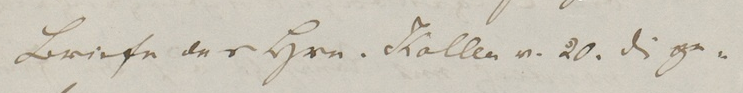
Briefe des Hrn. Koller v. 20. d. ge-
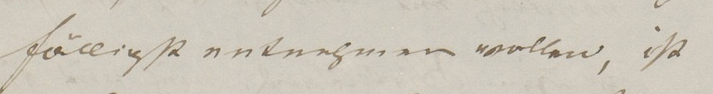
fälligst entnehmen wollen, ist
